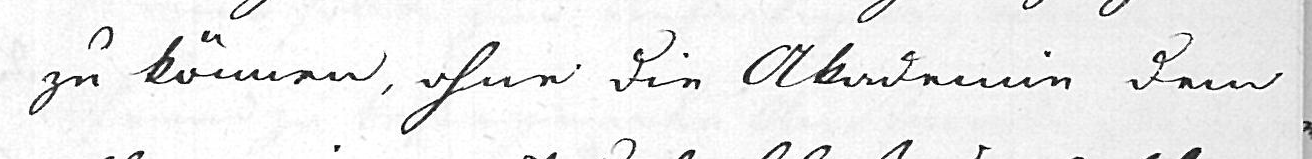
zu können, ohne die Akademie dem
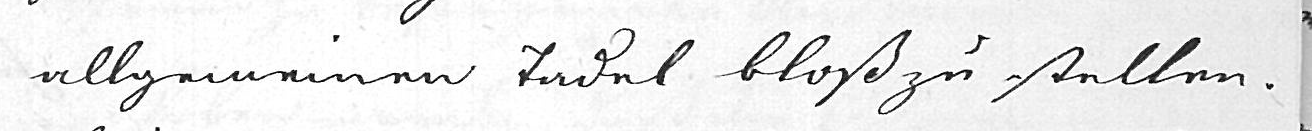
allgemeinen Tadel bloß zu stellen.
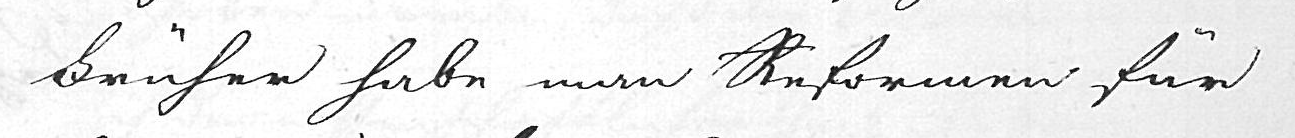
Früher habe nen Reformen für
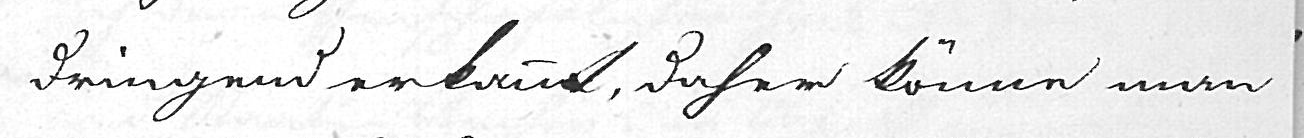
dringend erkannt, daher könne man
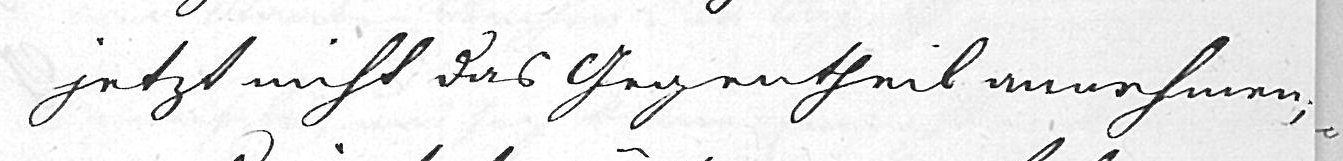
jetzt nicht das Gegentheil annehmen,
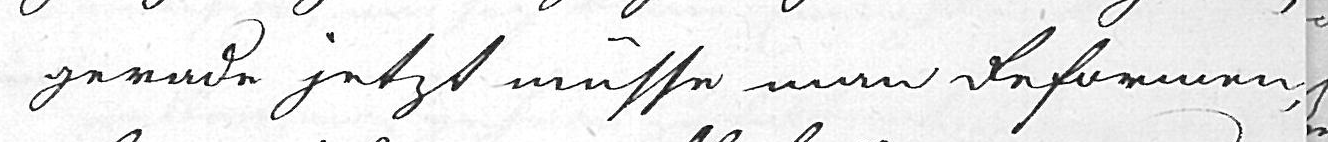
gerade jetzt müsse man Reformen,
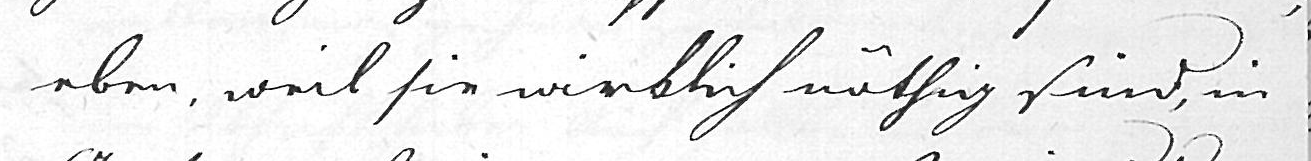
eben, weil sie wirklich nöthig sind, in
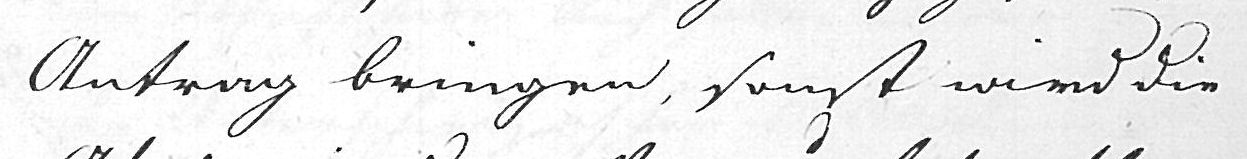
Antrag bringen, sonst wird die
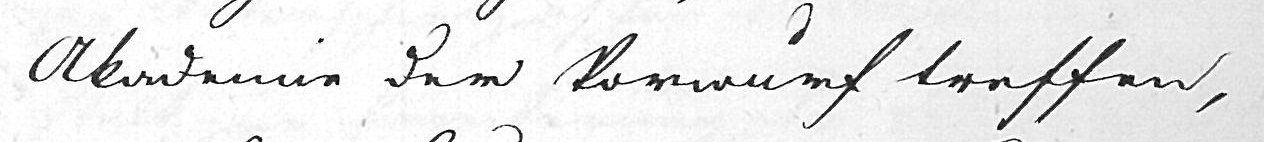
Akademie der Vorwurf treffen
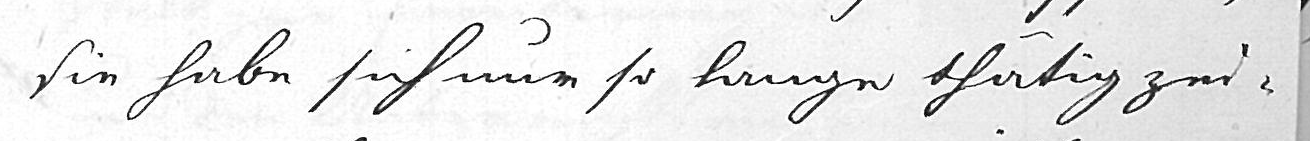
sie habe sich nur so lange thätig zei-
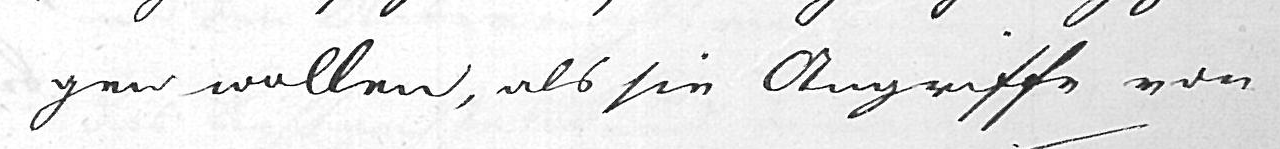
gen wollen, als sie Angriffe von
